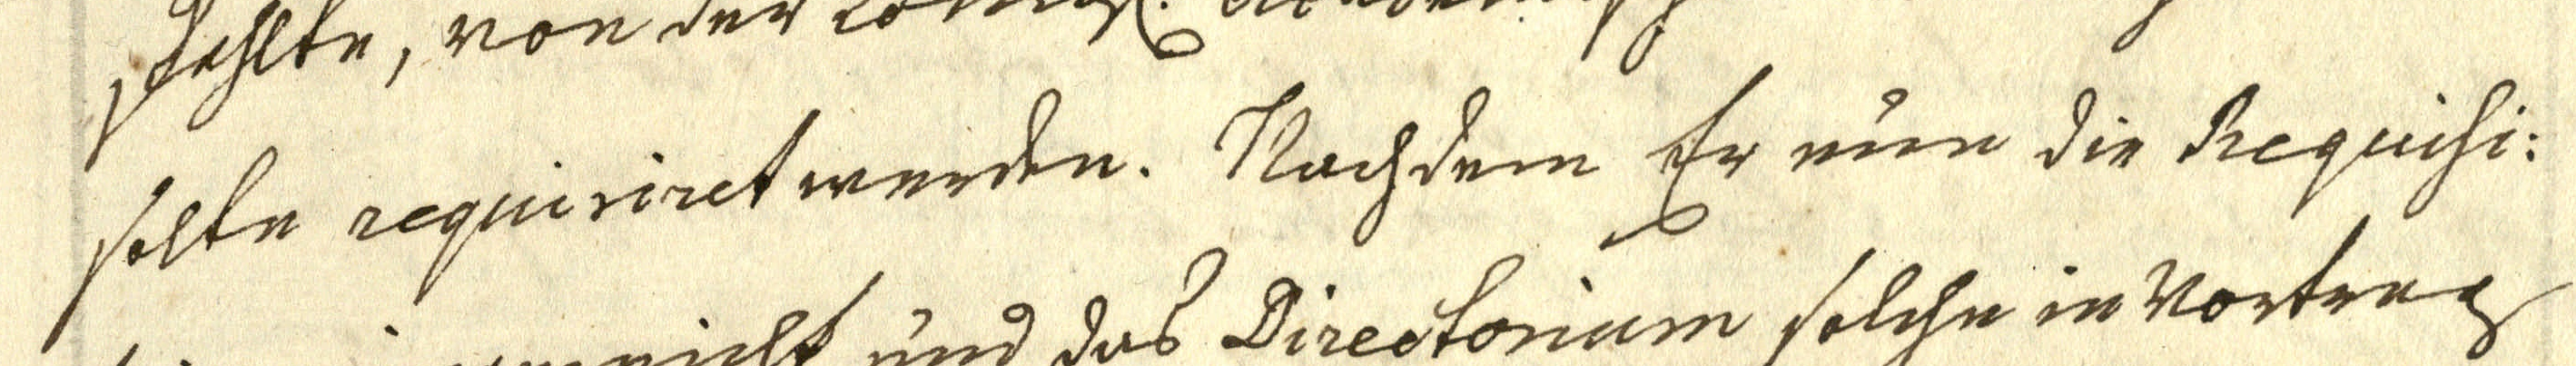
solte requiriret werden. Nachdem Er nun die Requisi¬
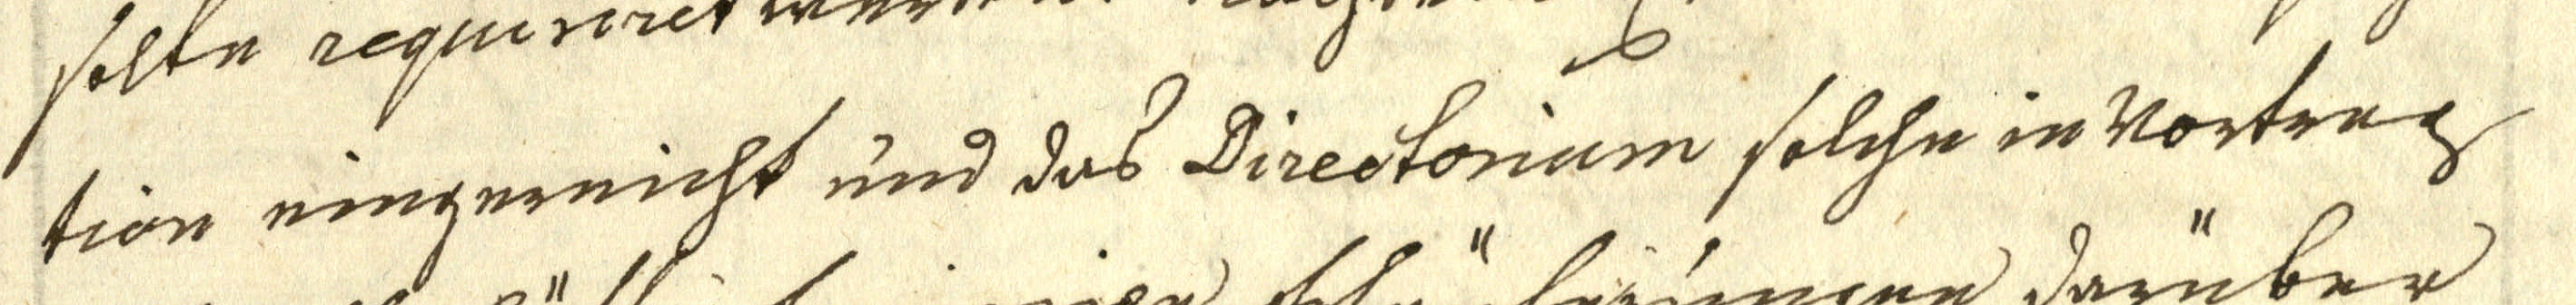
tion eingereicht und das Directorium solche in Vortrag
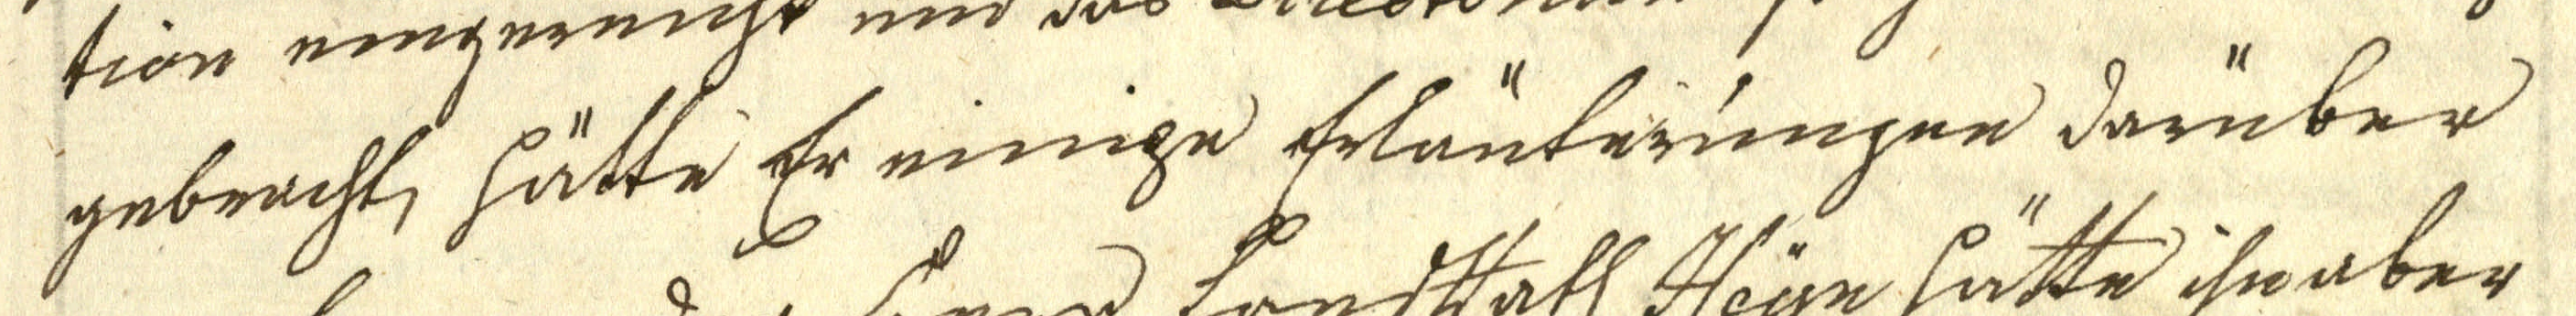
gebracht, hätte Er einige Erläuterungen darüber
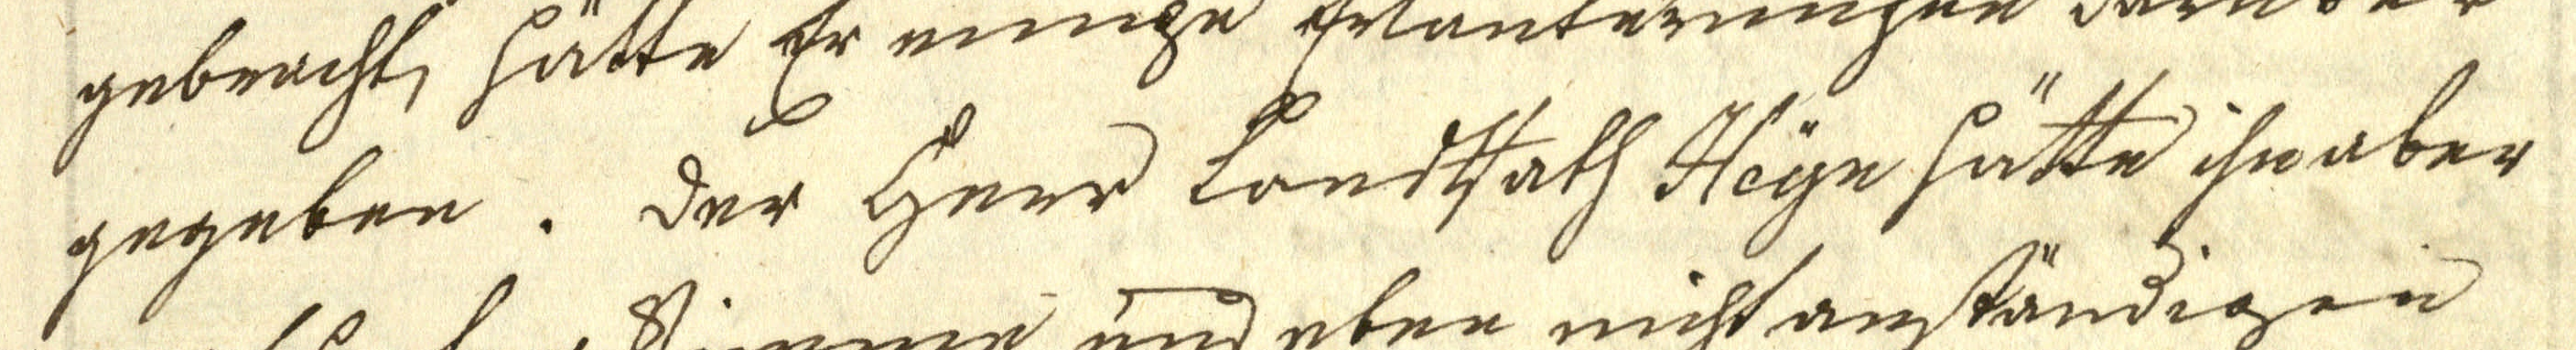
gegeben. der Herr LandRath Heÿn hätte ihn aber
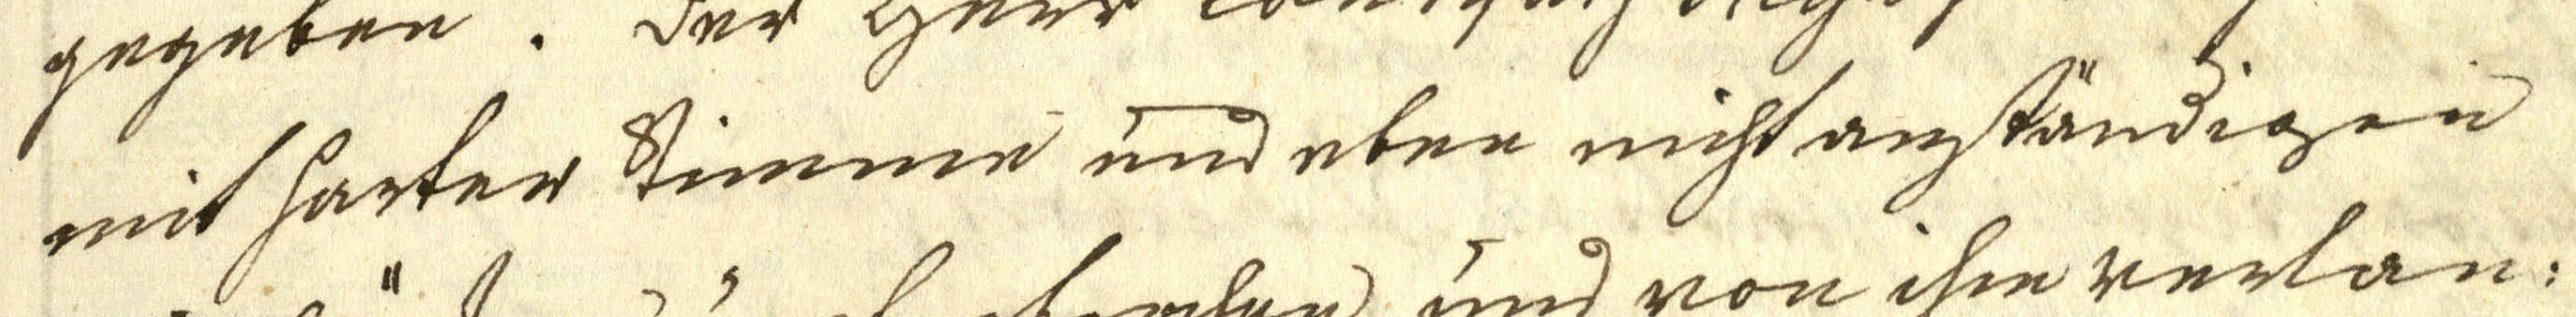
mit harter Stimme und eben nicht anständigen
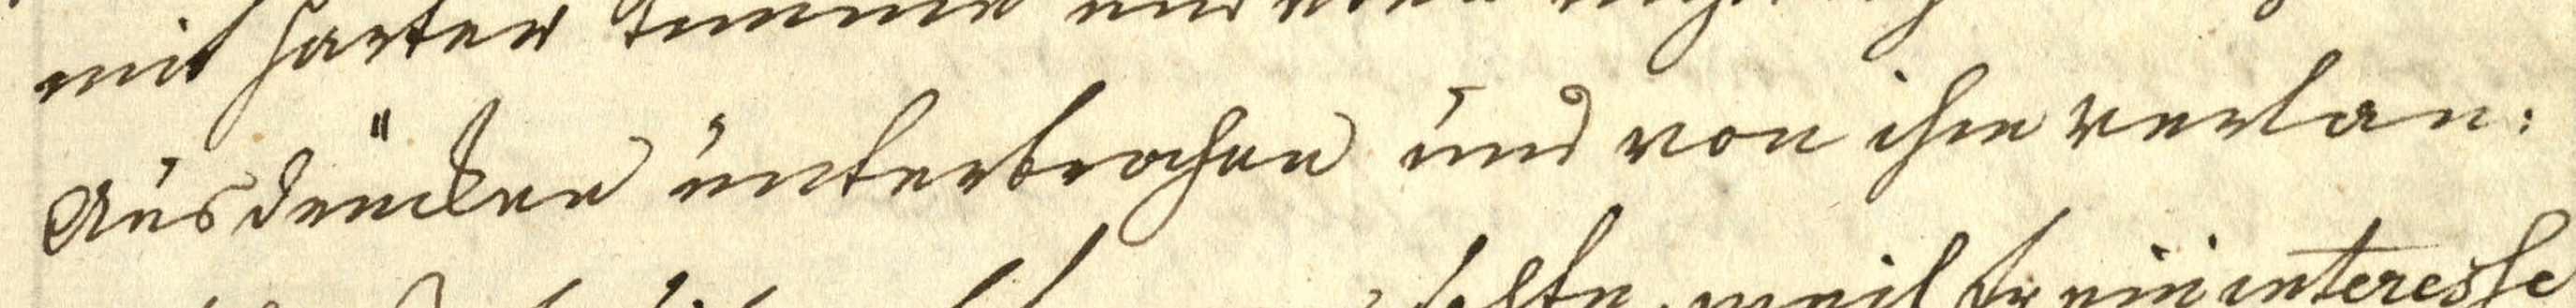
Ausdrücken unterbrochen und von ihm verlan¬
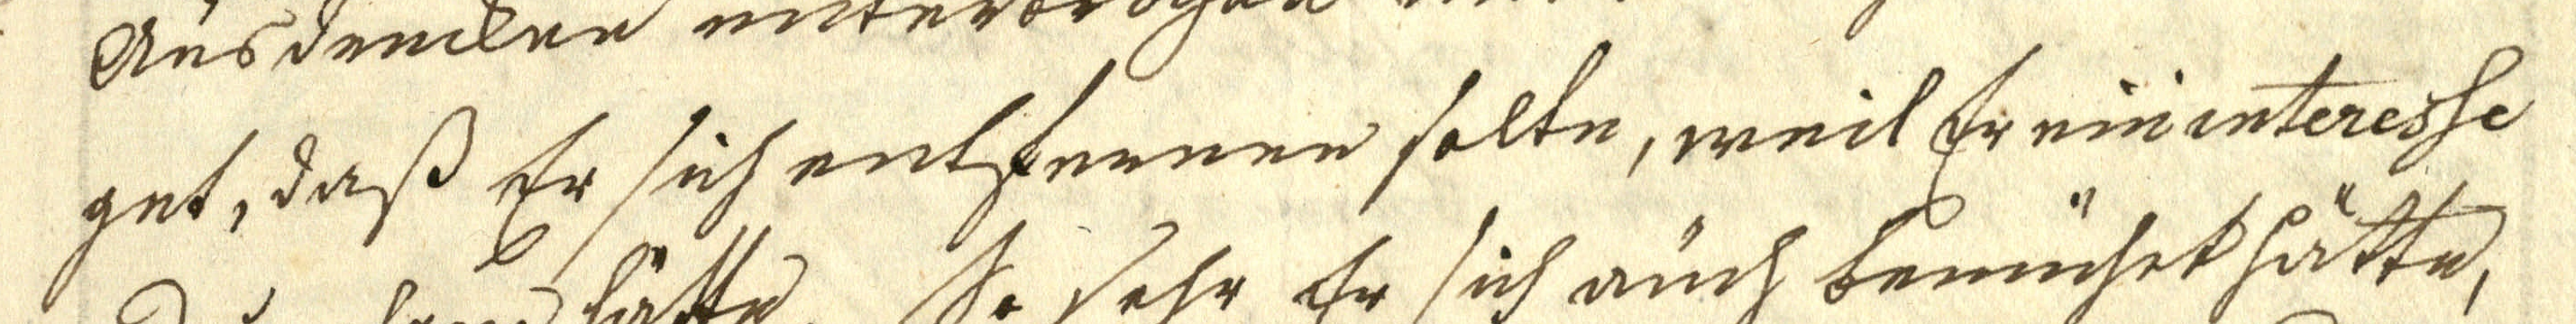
get, daß Er sich entfernen solte, weil Er ein interesse
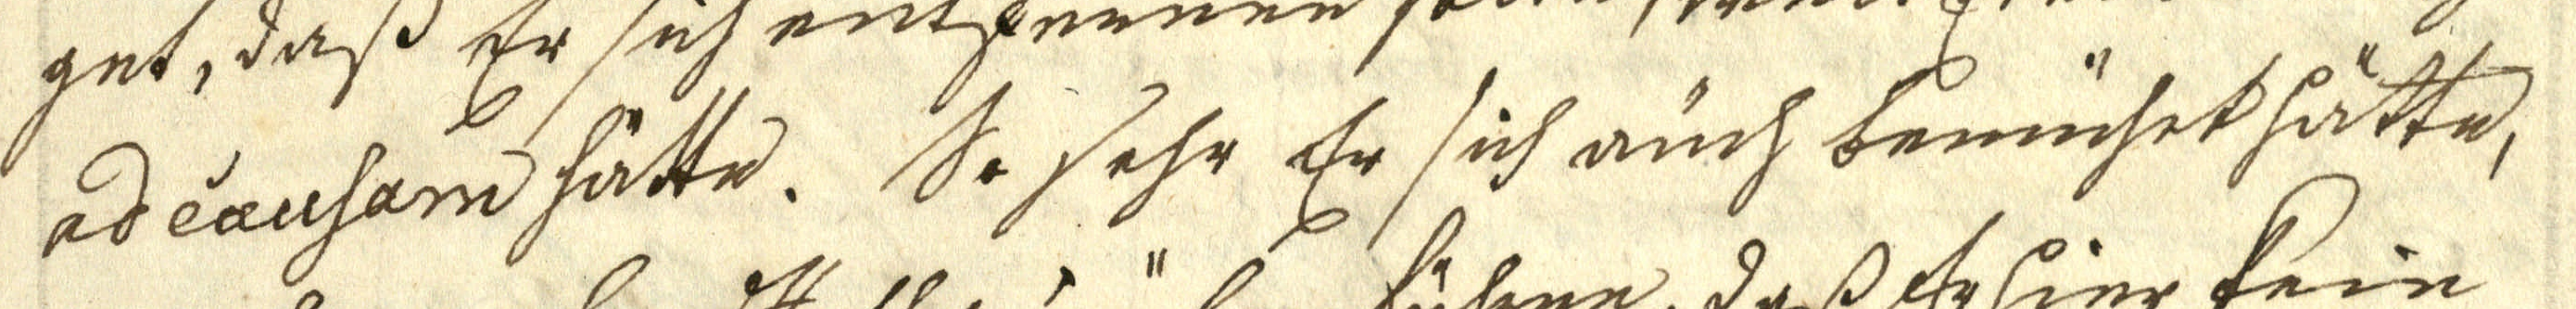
ad causam hätte. So sehr Er sich auch bemühet hätte,
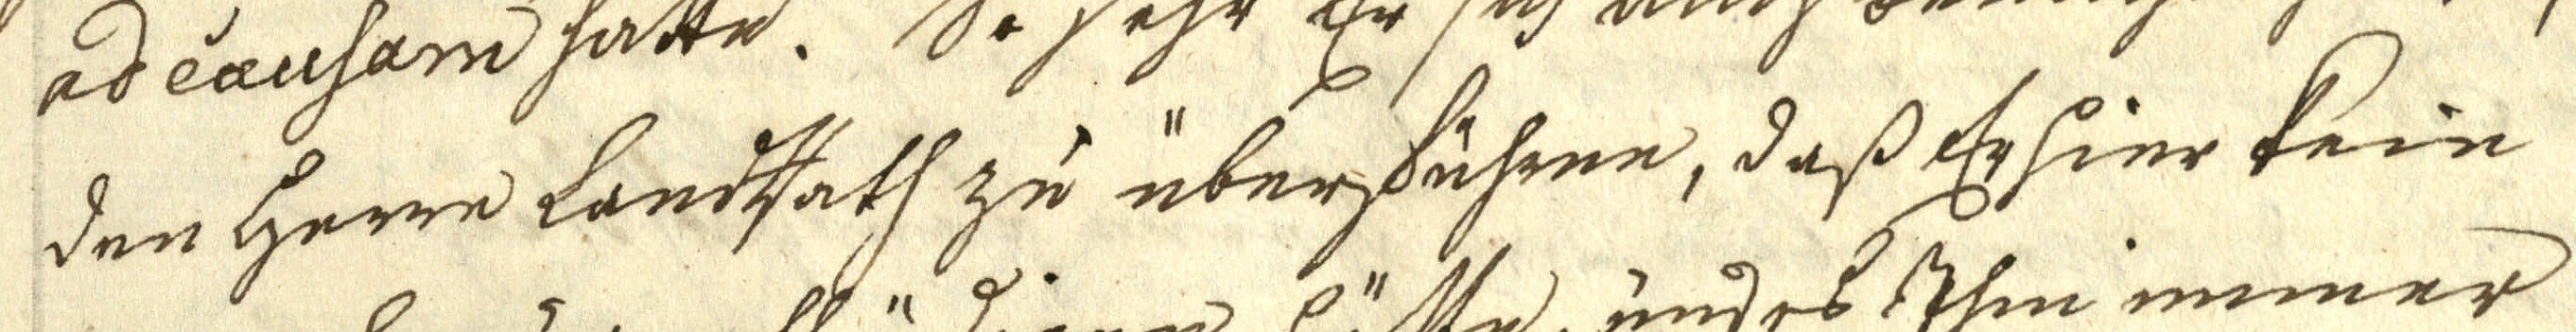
den Herrn LandRath zu überführen, daß Er hier kein
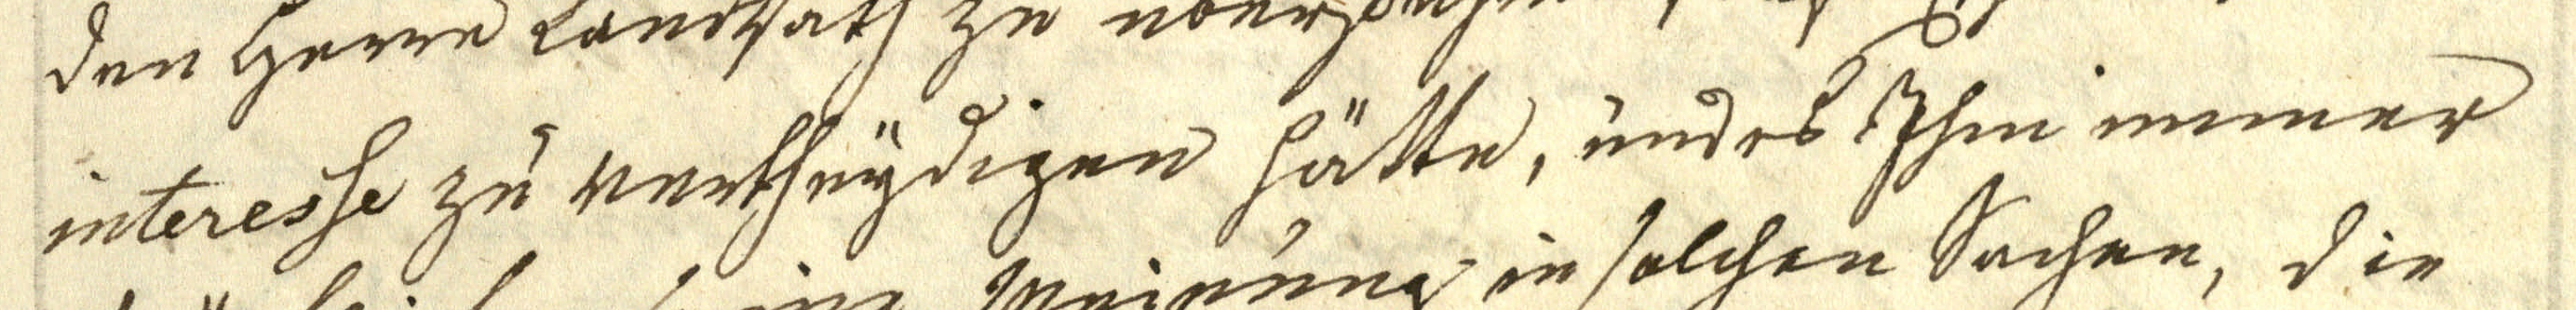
interesse zu vertheidigen hätte, und es Ihm immer
